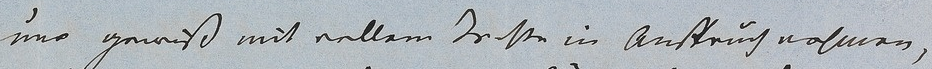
uns gewiß mit vollem Rechte in Anspruch nehmen,
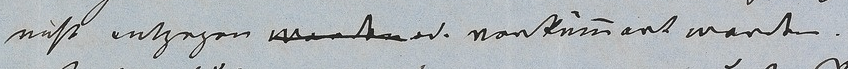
nicht entzogen werden od. verkümmert werden.
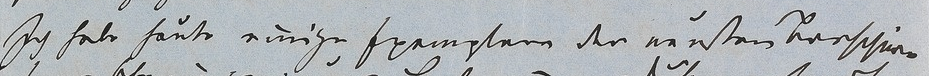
Ich habe heute einige Exemplare der neusten Broschüre
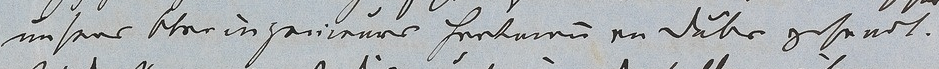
unsers Oberingenieurs Hartmann an Dubs gesandt.
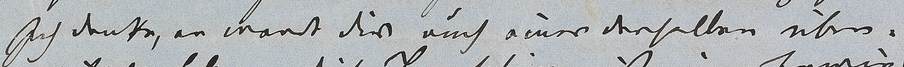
Ich denke, er werde dir auch eines derselben über-
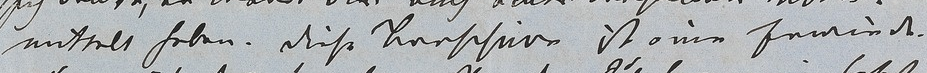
mittelt haben. Diese Broschüre ist eine Erwiede-
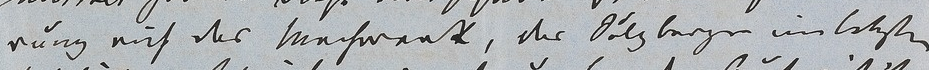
rung auf das Machwerk, das Sulzberger im letzten
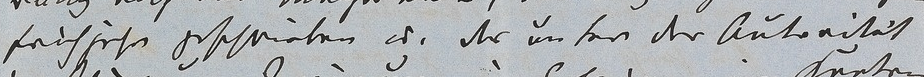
Frühjahr geschrieben u. das unter der Autorität
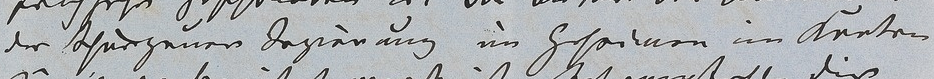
der Thurgauer Regierung im Geheimen im Kanton
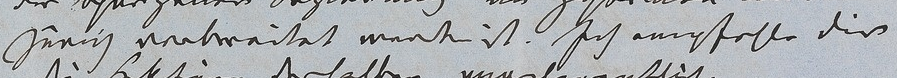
Zürich verbreitet worden ist. Ich empfehle dir
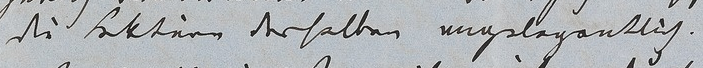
die Lektüre derselben angelegentlich.
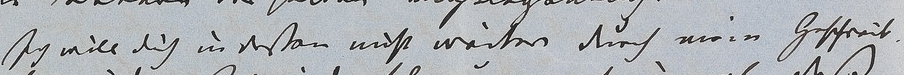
Ich will dich indeßen nicht weiter durch mein Geschreib-
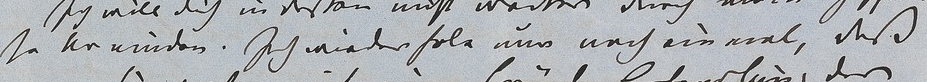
se ermüden. Ich wiederhole nur noch einmal, daß
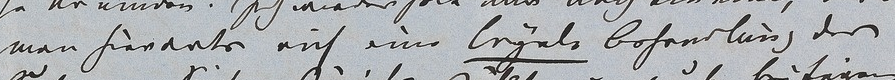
man hierorts auf eine loyale Behandlung der
